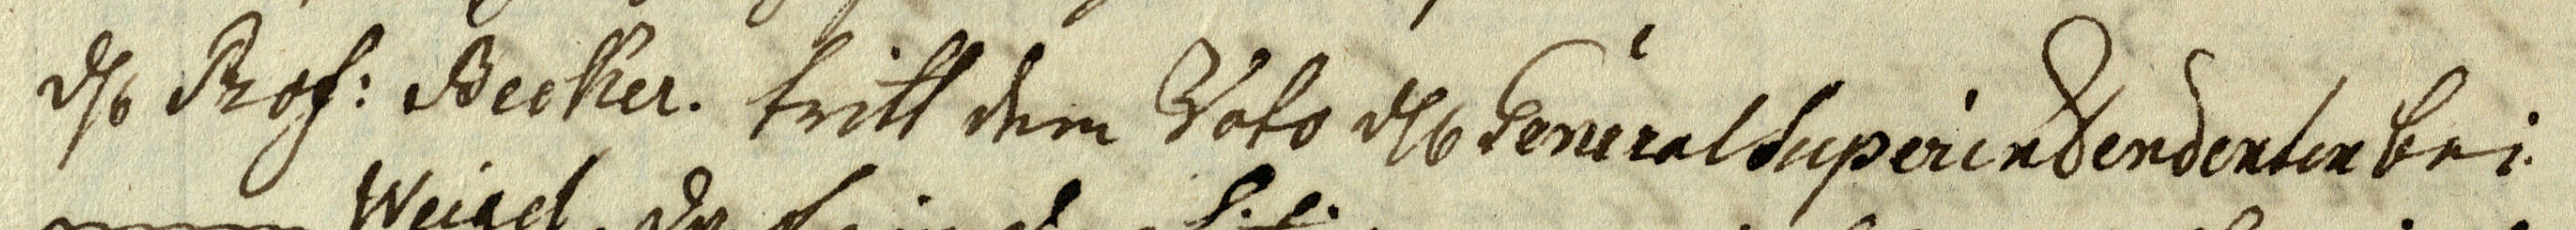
dh Prof. Becker. tritt dem Voto dh GeneralSuperintendenten bei.
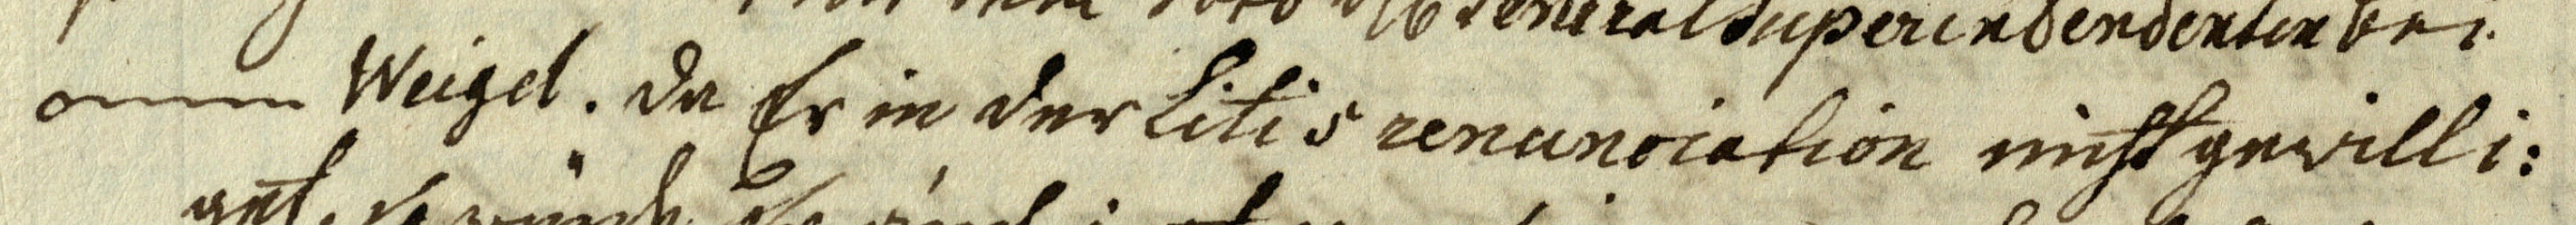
Weigel. da Er in der Litis renunciation nicht gewilli¬
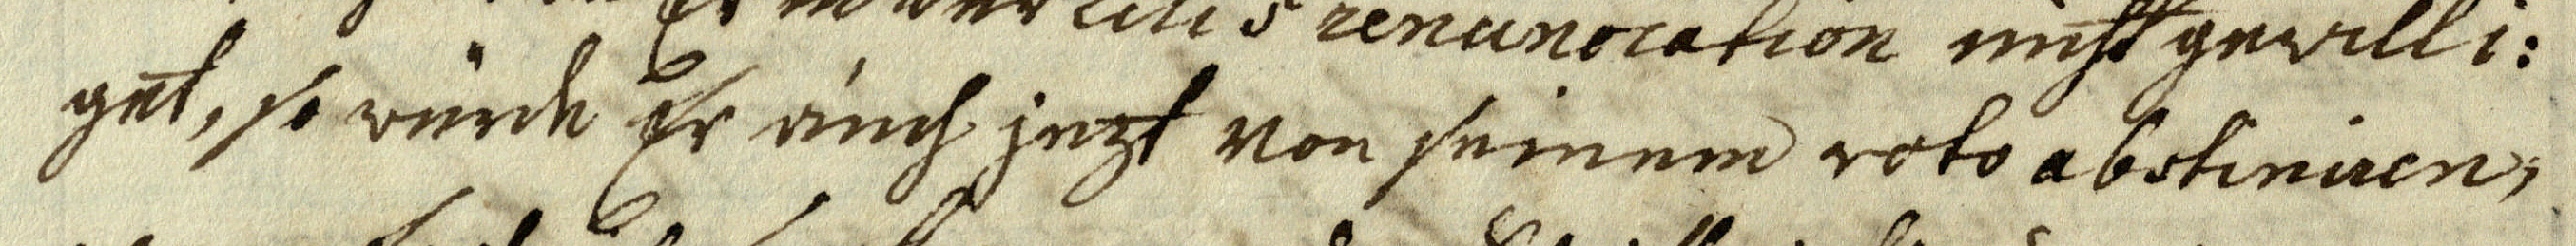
get, so würde Er auch jezt von seinem voto abstiniren,
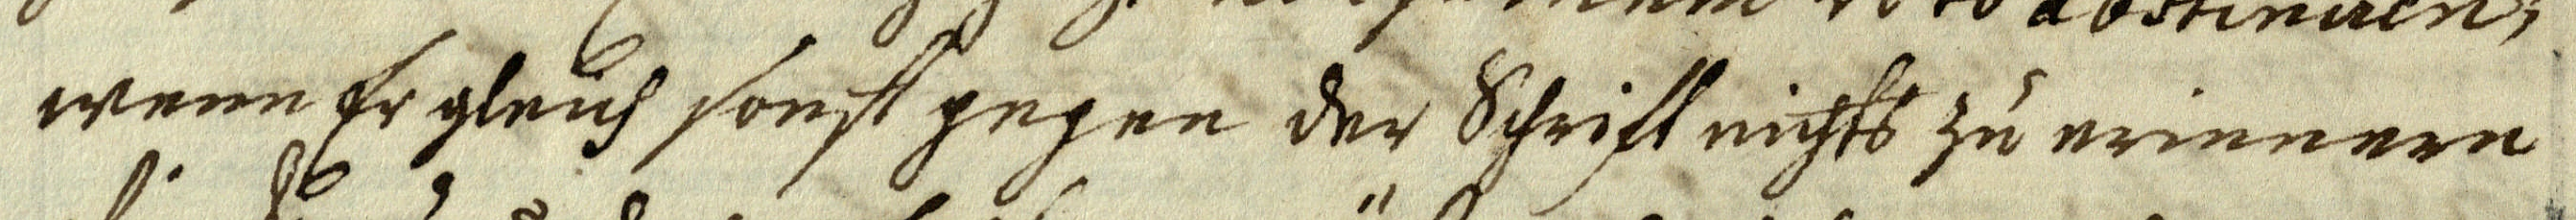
wenn Er gleich sonst gegen der Schrift nichts zu erinnern
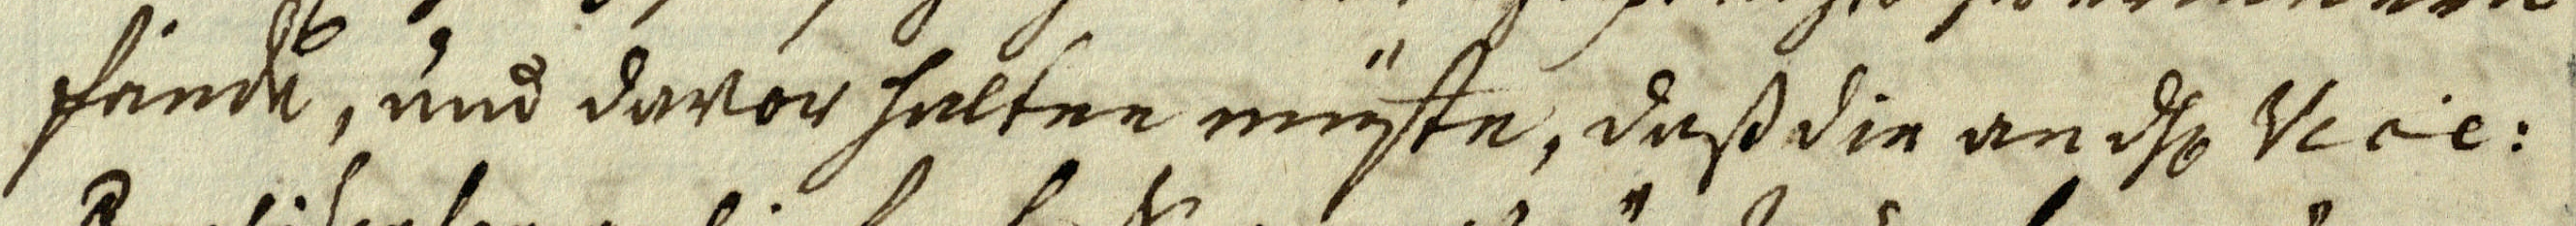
fände, und davor halten müste, daß die an dh Vice¬
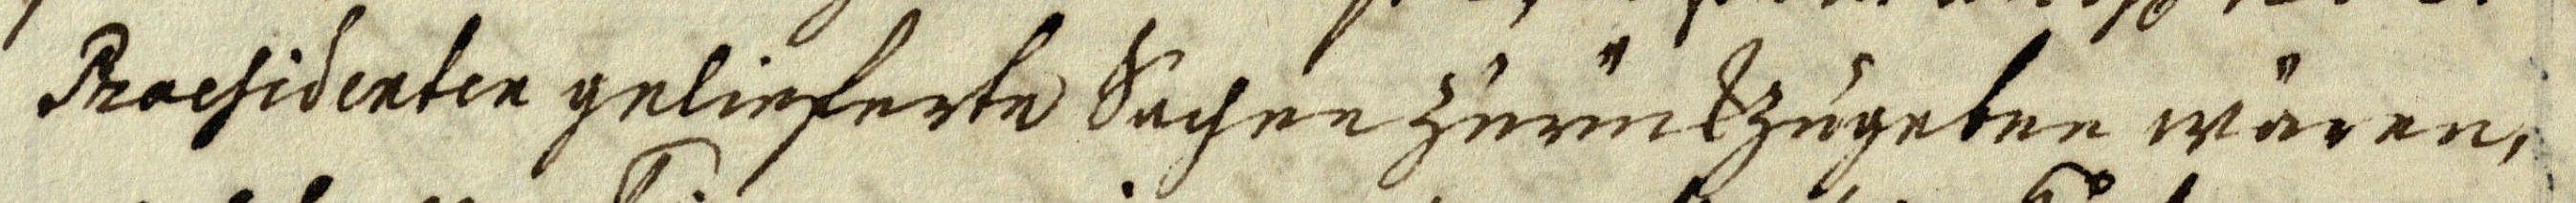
Praesidenten gelieferte Sachen zurückzugeben wären,
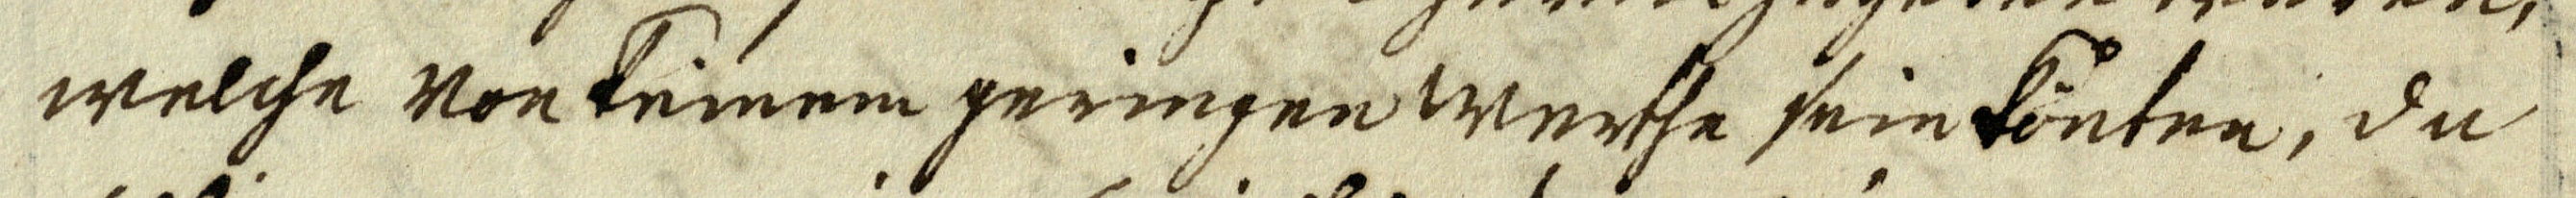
welche von keinem geringen Werthe sein könten, da
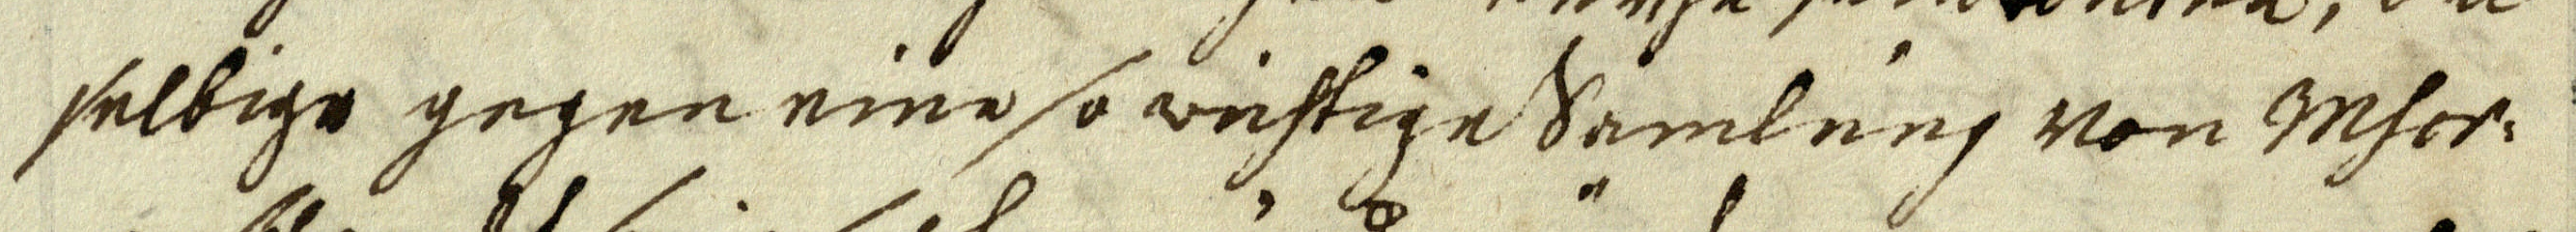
selbige gegen eine so wichtige Samlung von Mscr.
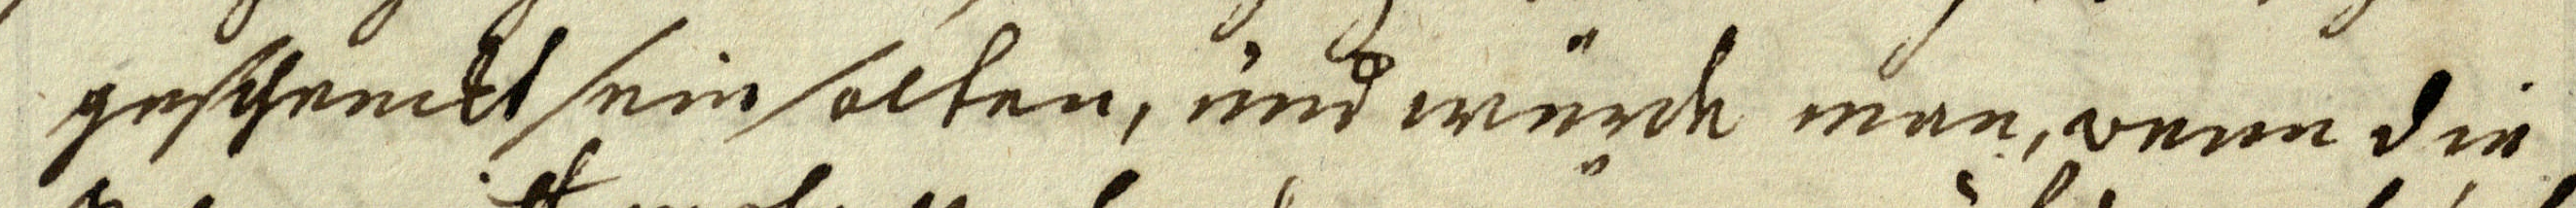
geschenckt sein solten, und würde man, wenn die
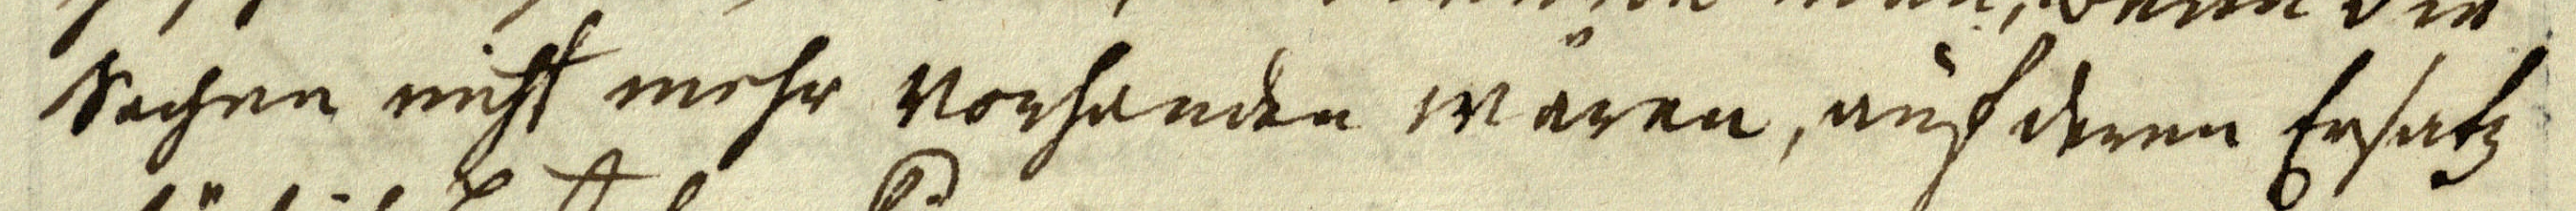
Sachen nicht mehr vorhanden wären, auf deren Ersatz
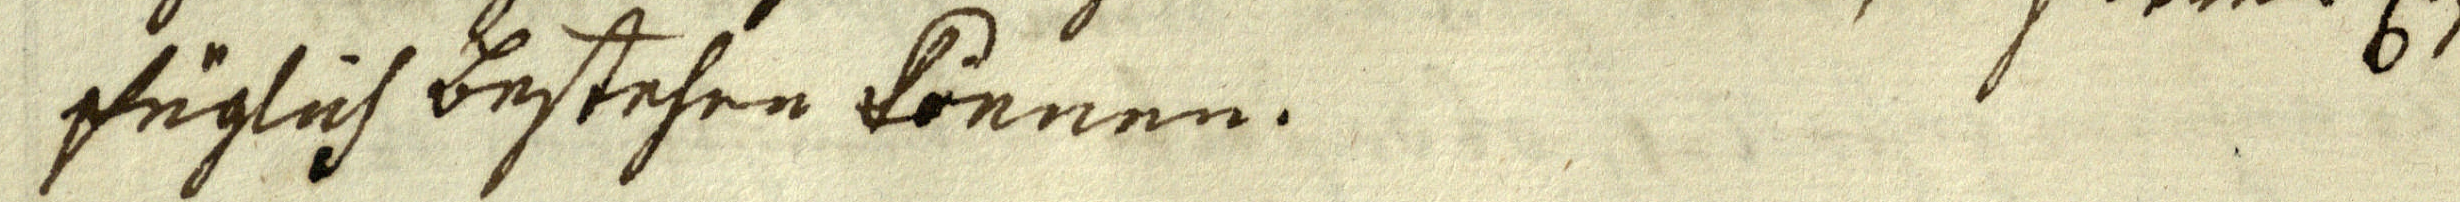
füglich bestehen können.
